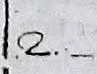2.
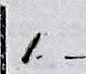1.
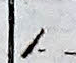1.
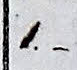1.
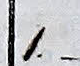1.
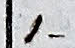1
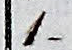1
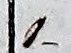1
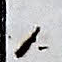1
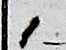1
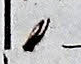1
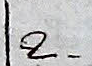2
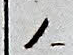1
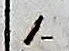1
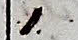1.
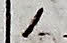1
